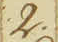2.
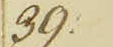39.
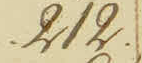212.
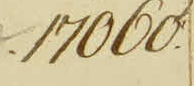17060.
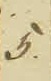5.
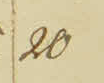20
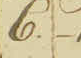6.
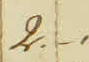2.
